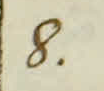8.
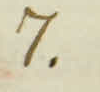7.
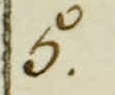5.
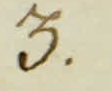3.
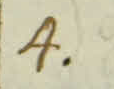4.
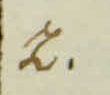2.
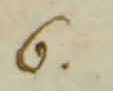6.
